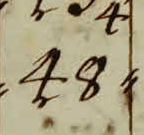48
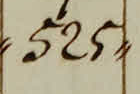525
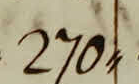270
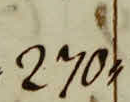270
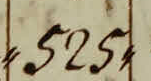525
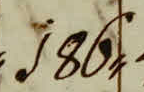186
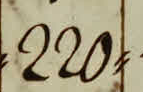220
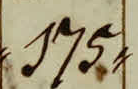175
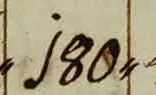180
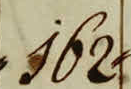162
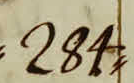284
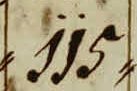115
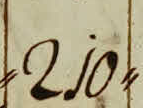210
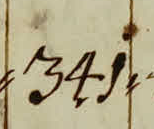341
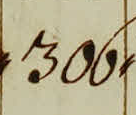306
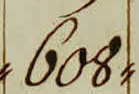608
